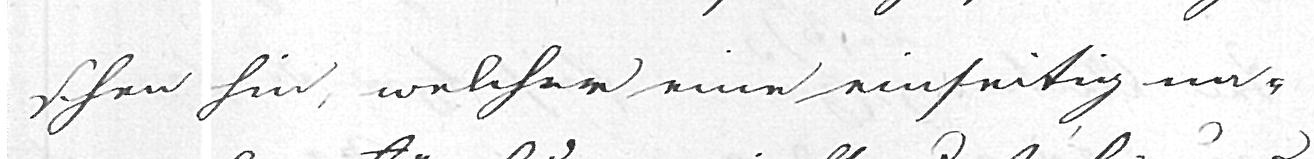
schen hin, welcher eine einseitig na-
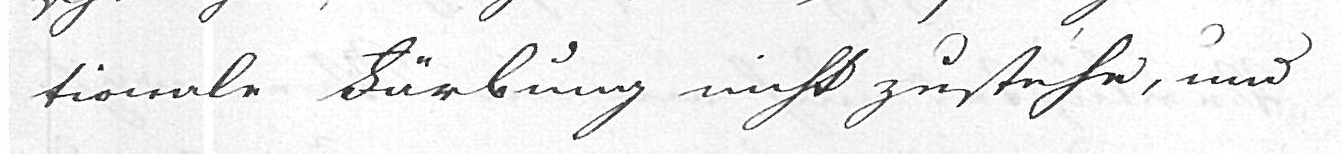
tionale Färbung nicht zustehe, und
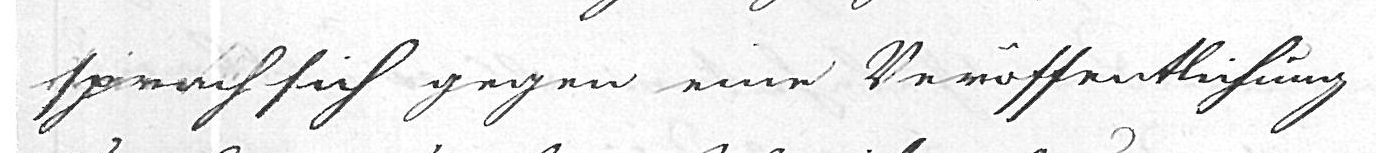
sprach sich gegen eine Veröffentlichung
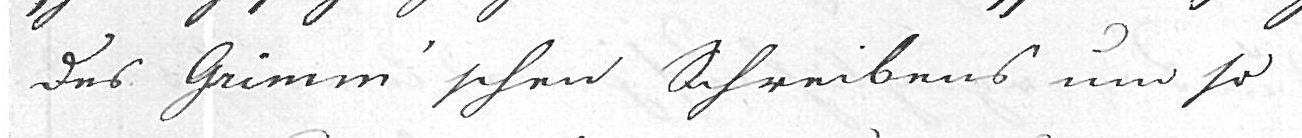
des Grimm'schen Schreibens und so
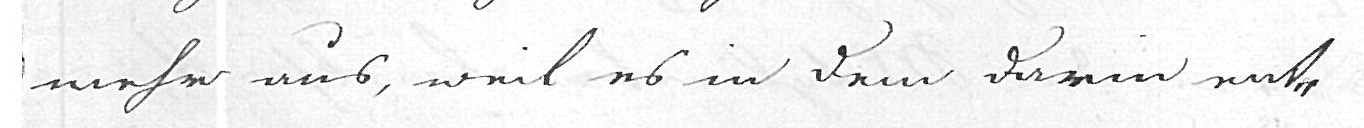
mehr aus, weil es in dem darin ent-
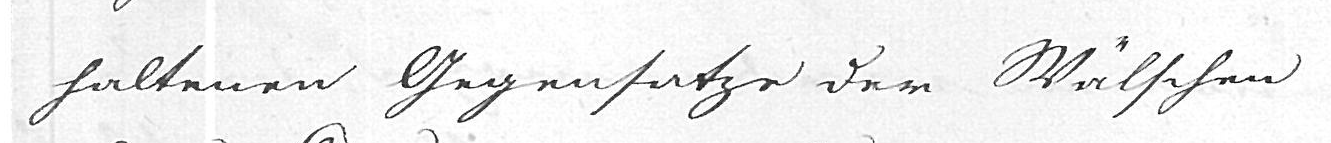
haltenen Gegensatze der Wälschen
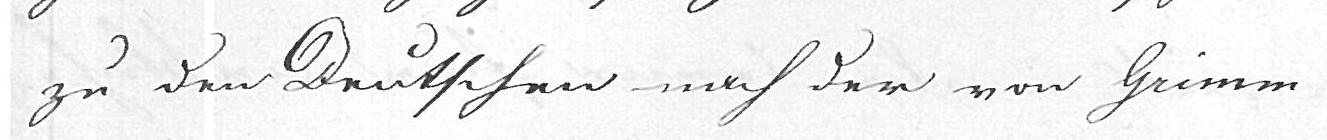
zu den Deutschen nach der von Grimm
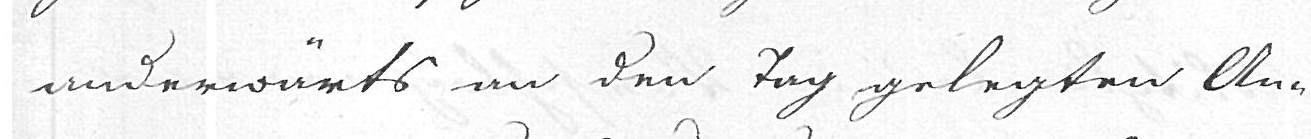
anderwärts an den Tag gelegten An
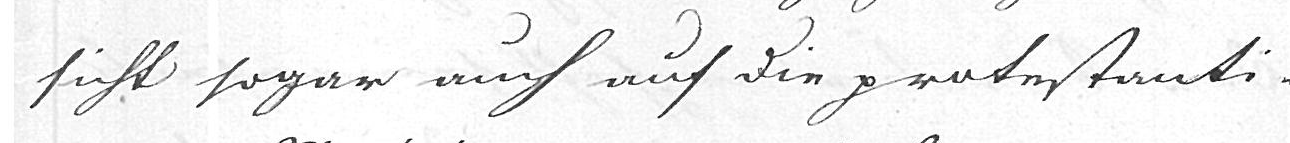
sicht sogar auch auf die protestanti-
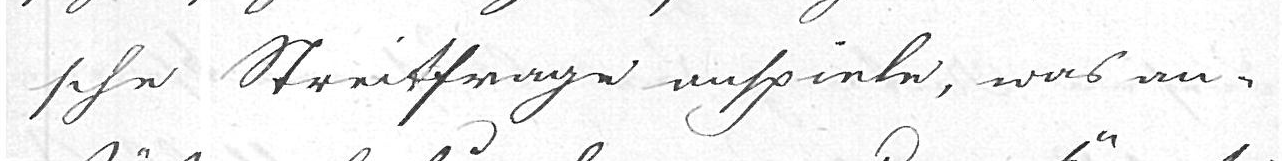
schen Streitfrage anspiele, was an-
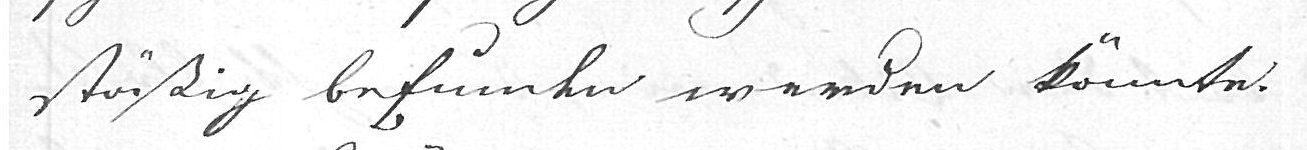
stößig befunden werden könnte.
